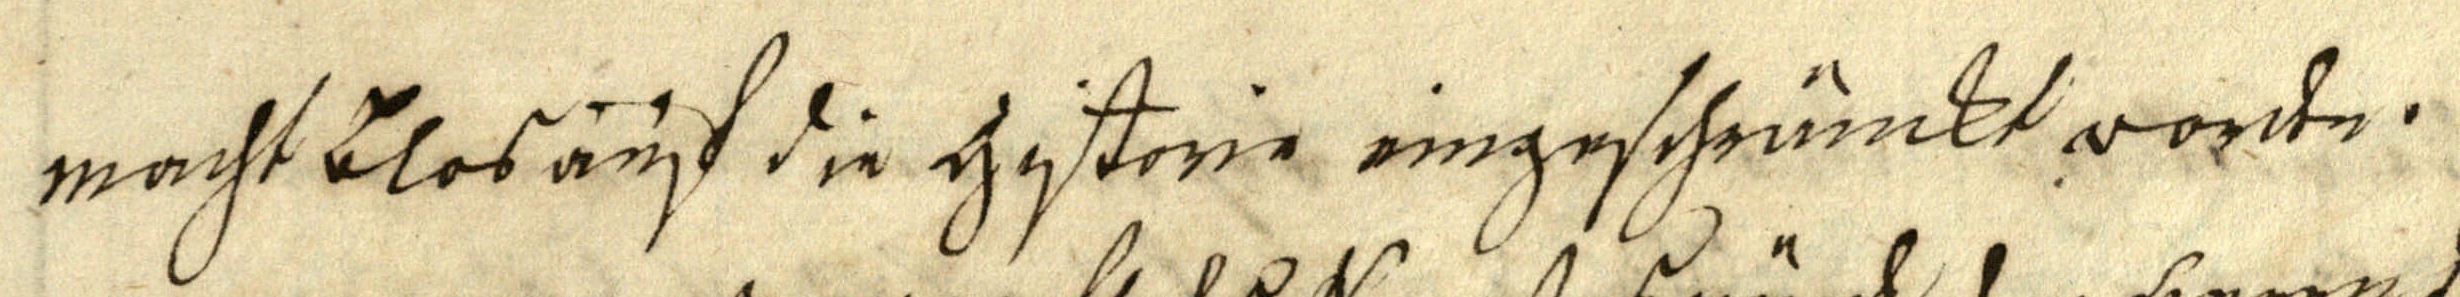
macht blos auf die Historie ingeschränckt worden¬
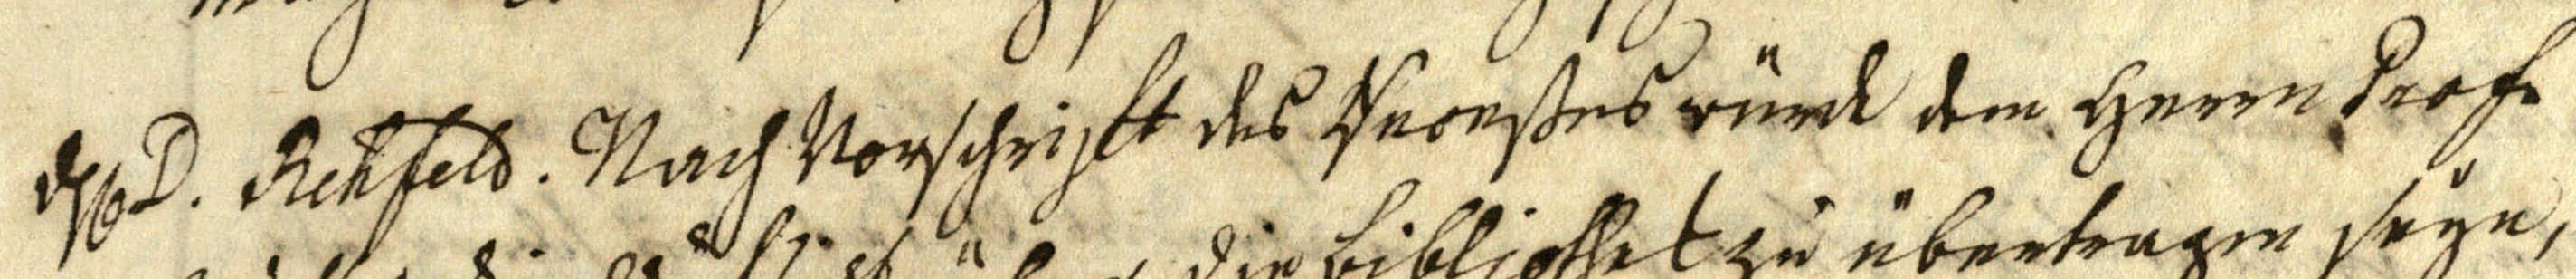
dh D. Rehfeld. Nach Vorschrift des Receßes würde dem Herrn Prof.
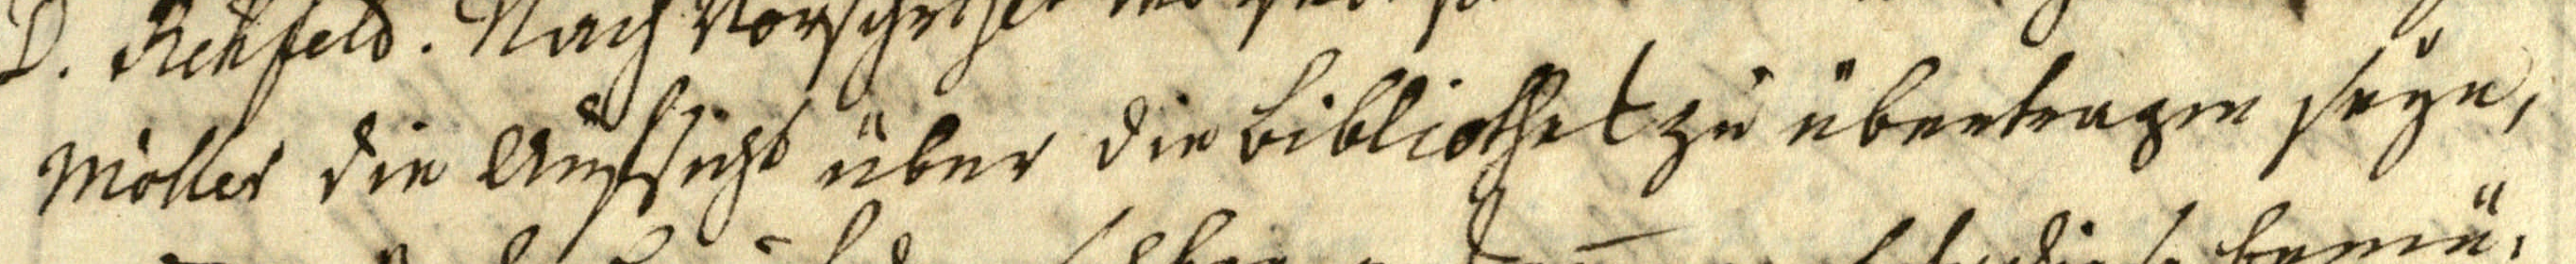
Möller die Aufsicht über die Bibliothek zu übertragen seÿn,
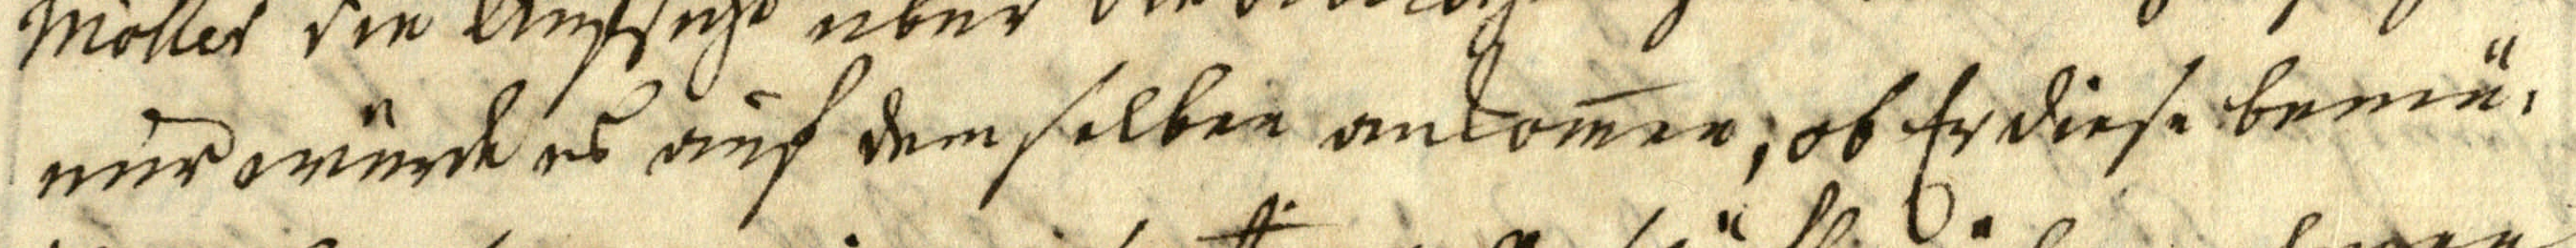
nur würde es auf dem selben ankomen, ob Er diese bemü¬
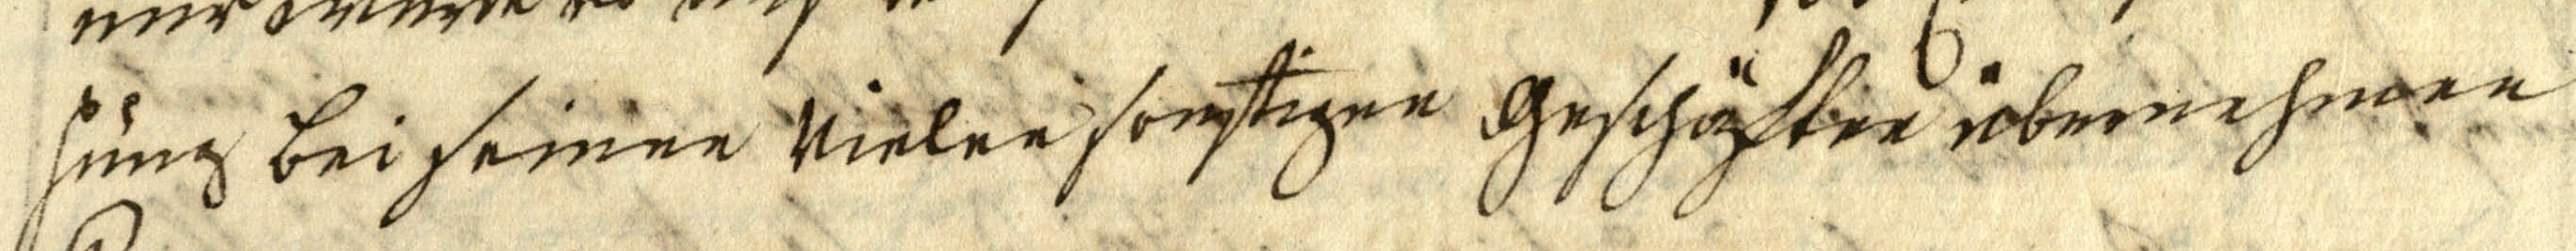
hung bei seinen vielen sonstigen Geschäften übernehmen
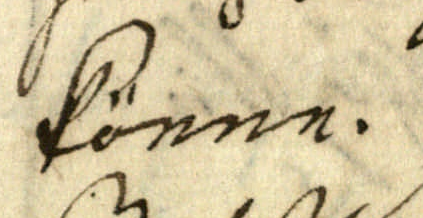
könne.
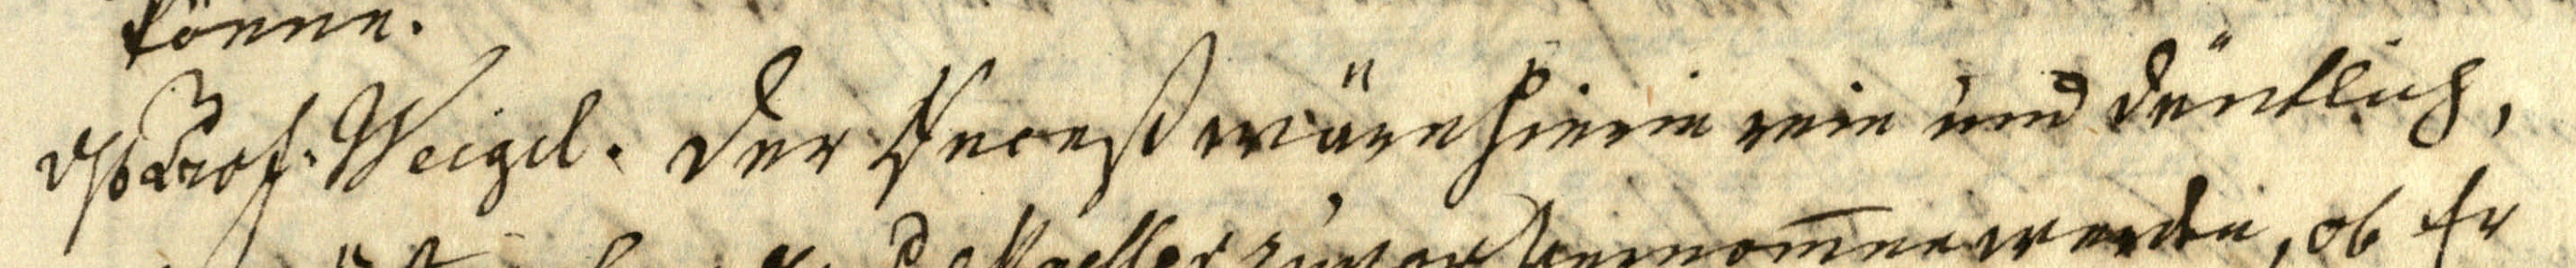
dh. Prof. Weigel. Der Receß wäre hierin rein und deutlich,
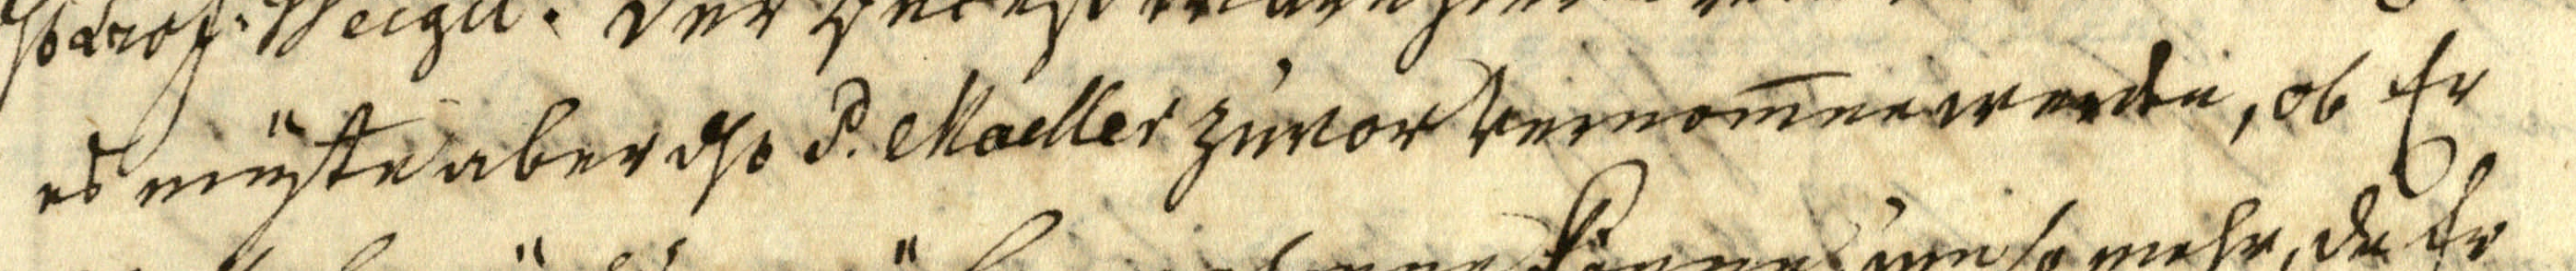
es müste aber dh. P. Moeller zuvor vernomen werden, ob Er
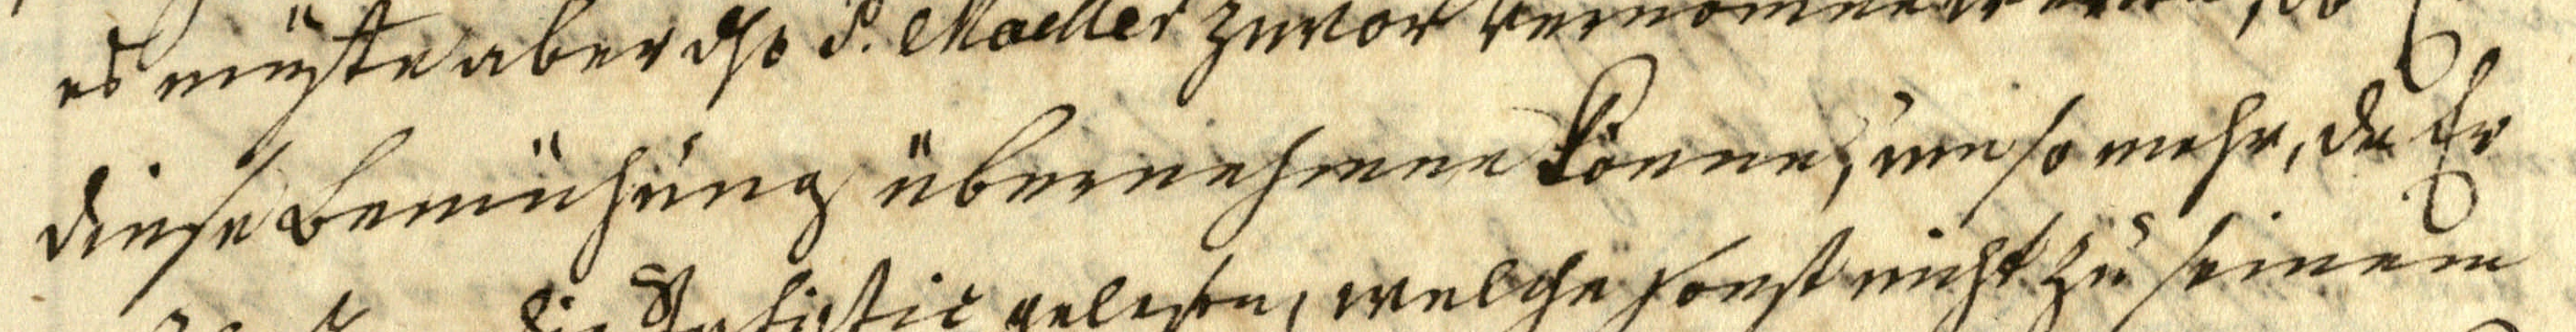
diese Bemühung übernehmen könne, umso mehr, da Er
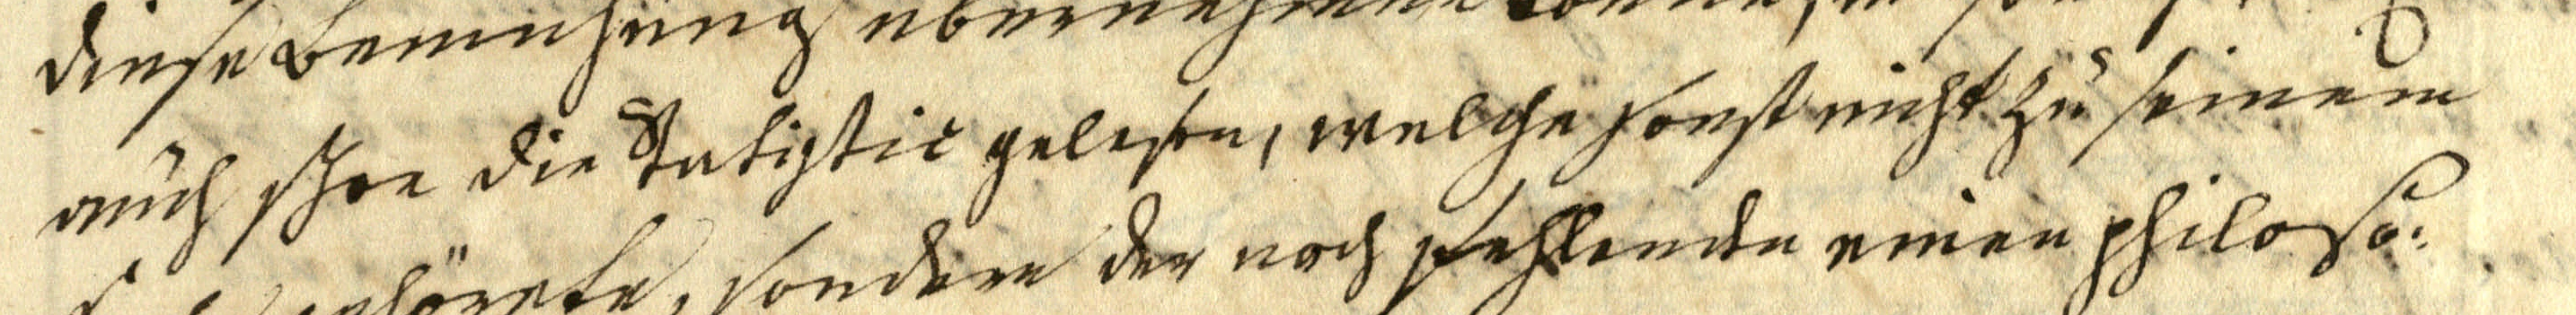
auch schon die Statistic gelesen, welche sonst nicht zu seinem
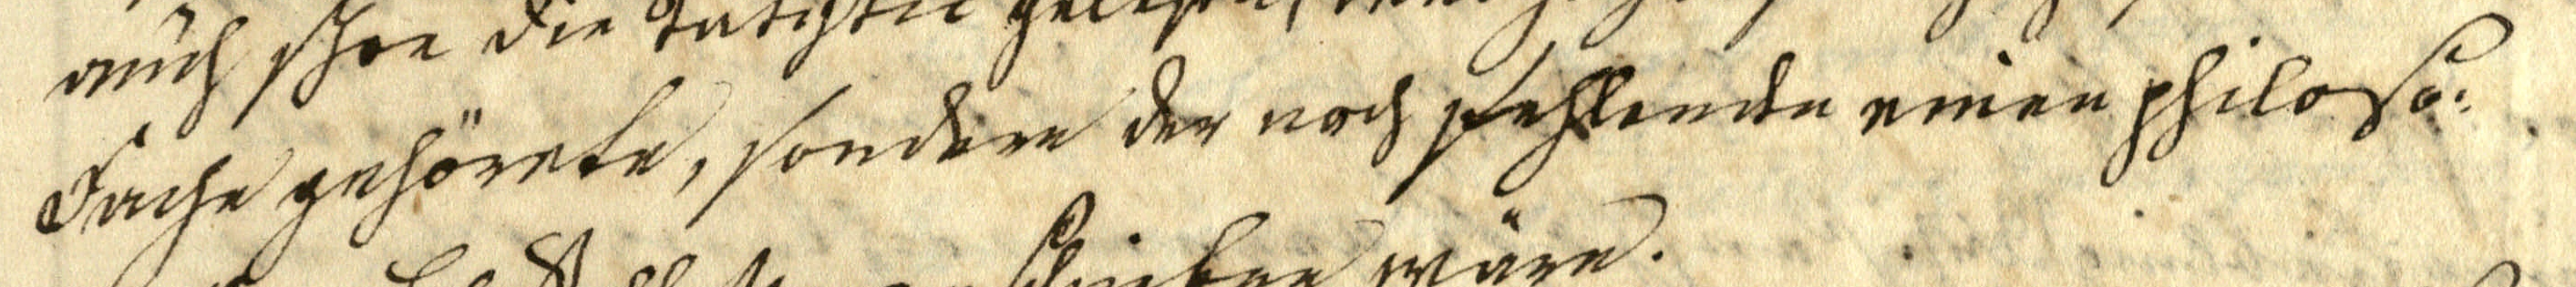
Fache gehörete, sondern der noch fehlenden einen philoso¬
